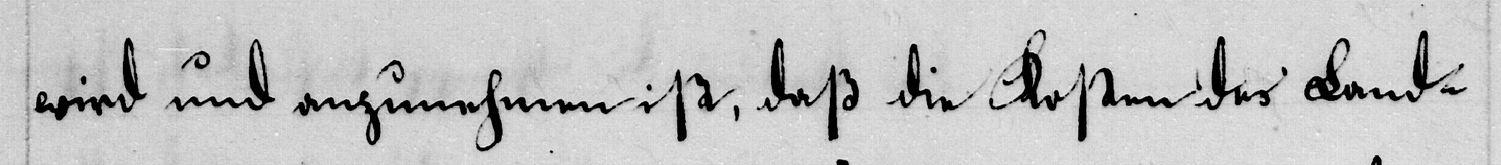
wird und anzunehmen ist, daß die Kosten des Land¬
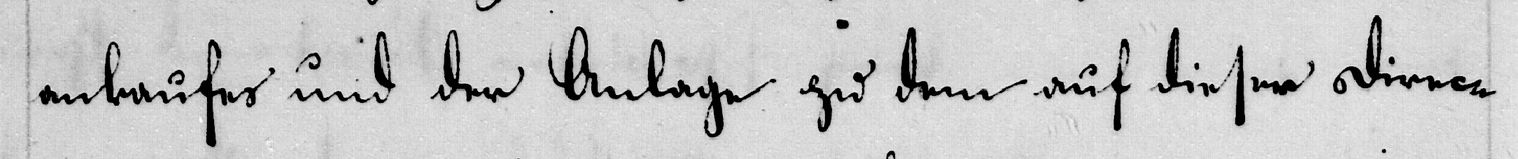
ankaufes und der Anlage zu dem auf dieser Direc¬
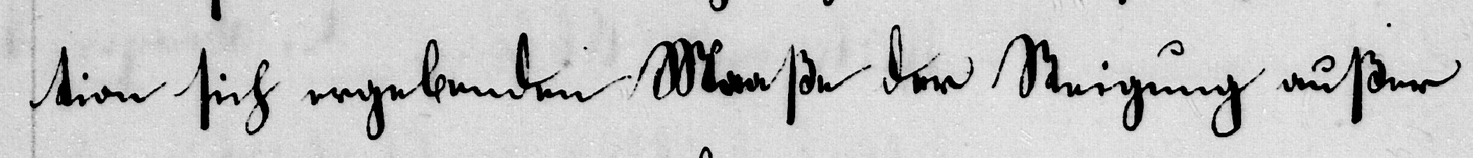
tion sich ergebenden Maaße der Steigung außer
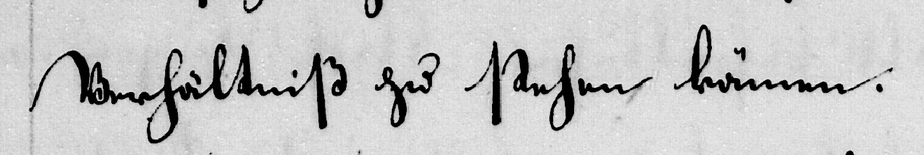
Verhältniß zu stehen kämen.
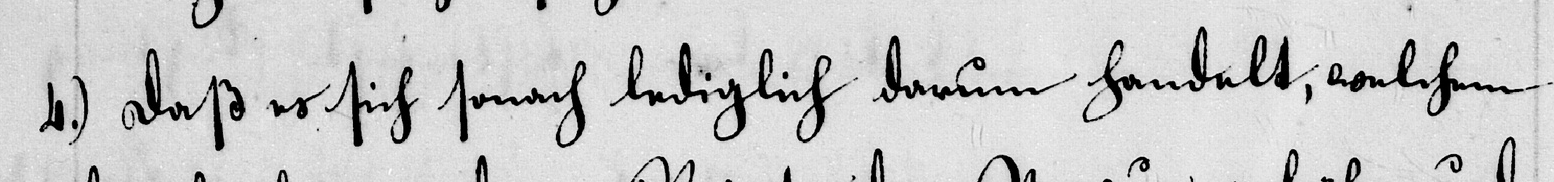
4.) Daß es sich sonach lediglich darum handelt, welchem
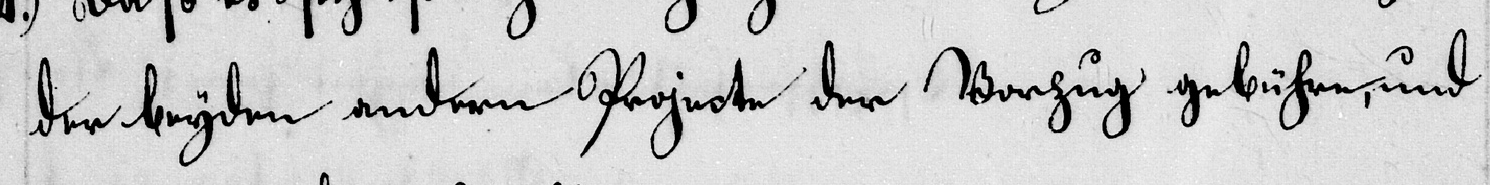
der beyden andern Projecte der Vorzug gebühre, und
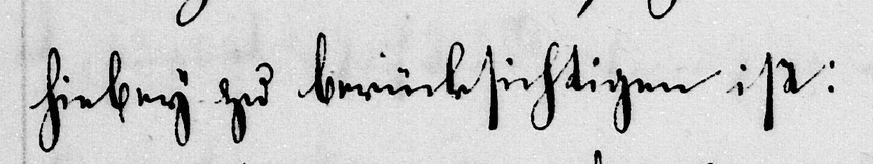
hiebey zu berücksichtigen ist:
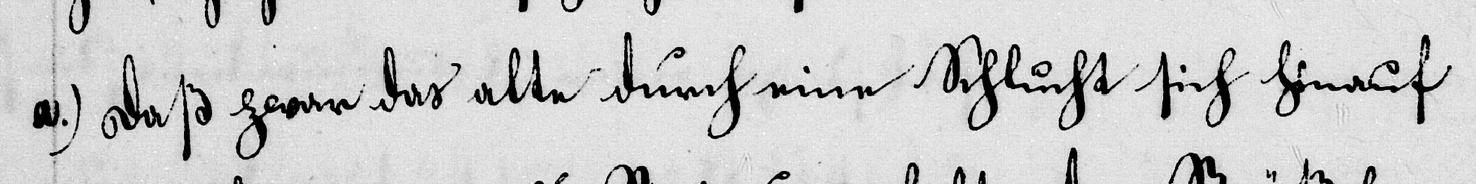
a.) Daß zwar das alte durch eine Schlucht sich hinauf
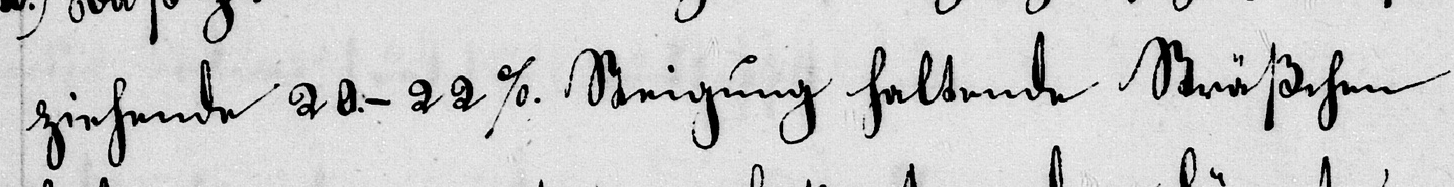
ziehende 20.–22% Steigung haltende Sträßchen
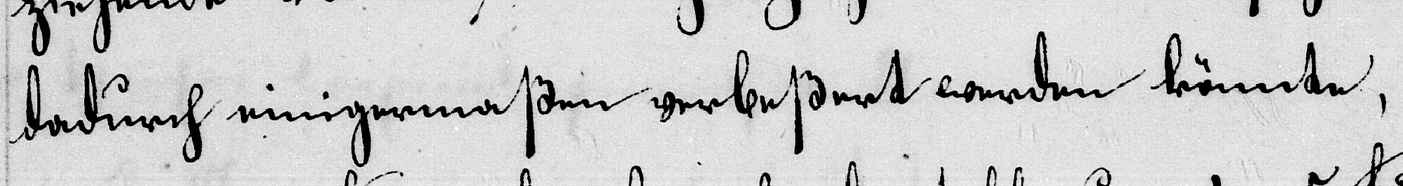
dadurch einigermaßen verbeßert werden könnte,
